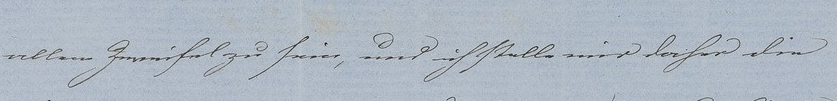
allem Zweifel zu sein, und ich stelle mir daher die
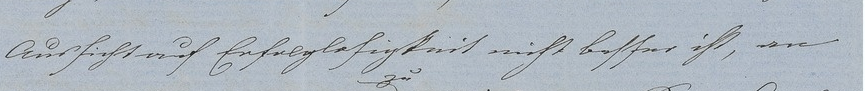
Aussicht auf Erfolglosigkeit nicht besser ist, an
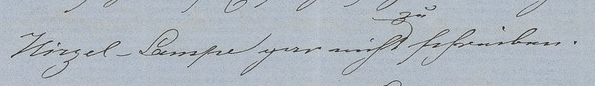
Hirzel-Lampe gar nicht zu schreiben.
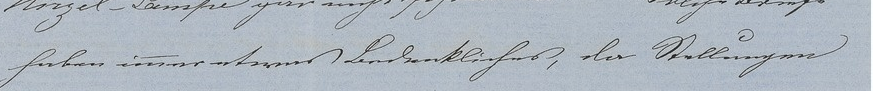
haben immer etwas Bedenkliches, da Stellungen
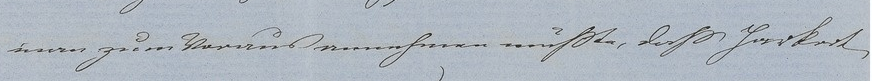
man zum Voraus annehmen müßte, daß Harkort
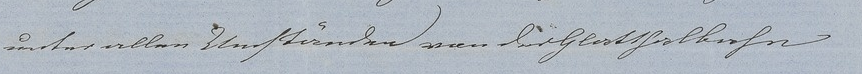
unter allen Umständen von der Glatthalbahn
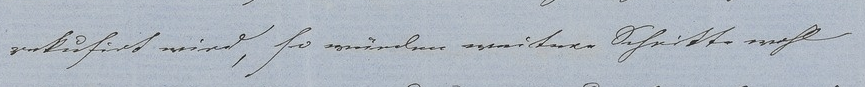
rekusirt wird, so würden weitere Schritte wohl
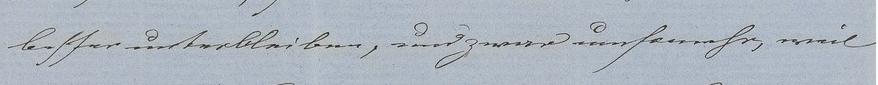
besser unterbleiben, und zwar umsomehr, weil
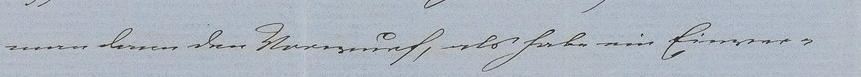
man dann den Vorwurf, als habe ein Einver-
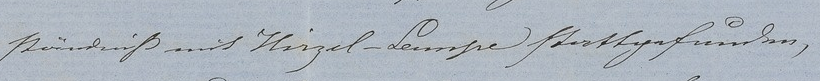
ständniß mit Hirzel-Lampe stattgefunden,
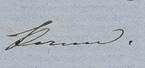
kann.
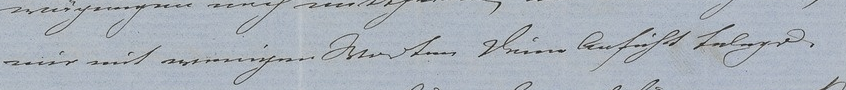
mir mit wenigen Worten Deine Ansicht telegr.
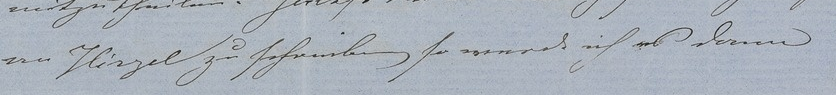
en Hirzel zu schreiben, so werde ich es dann
